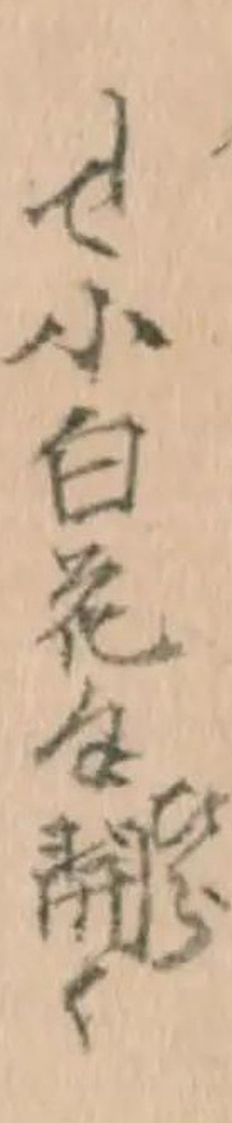して小白花を開く

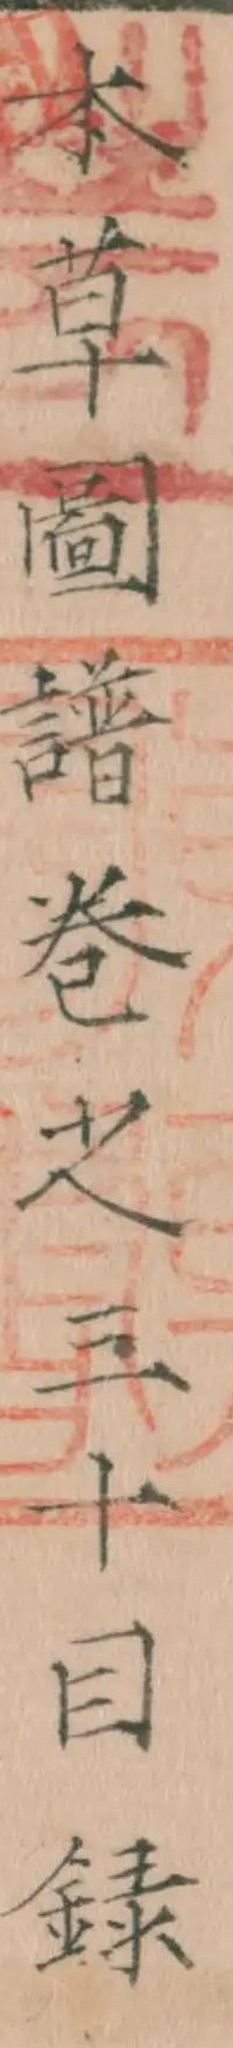本草図譜巻之三十目録
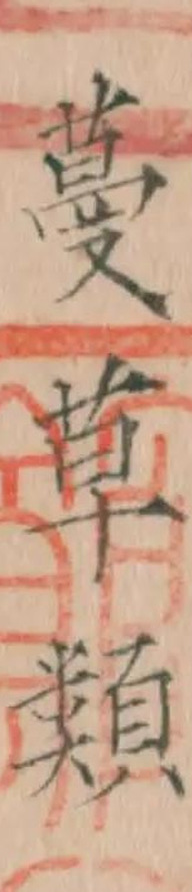蔓草類

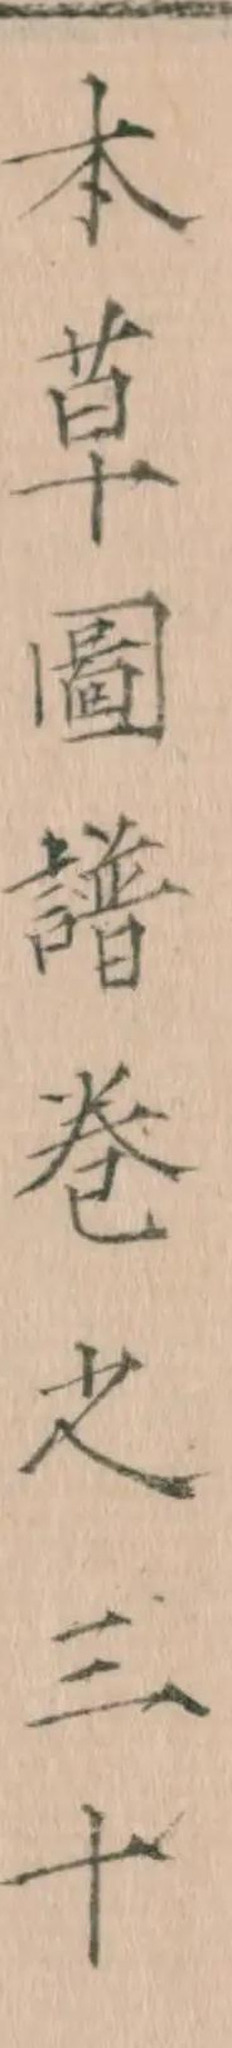本草図譜巻之三十
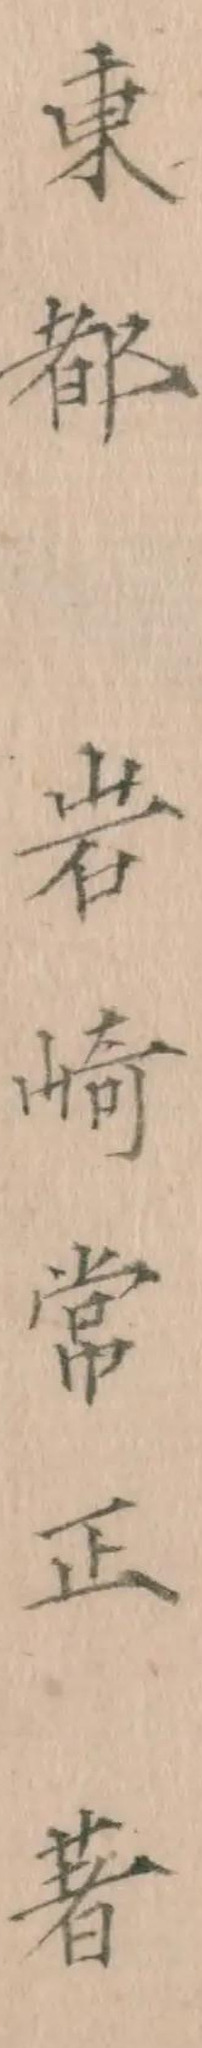東都岩崎常正著
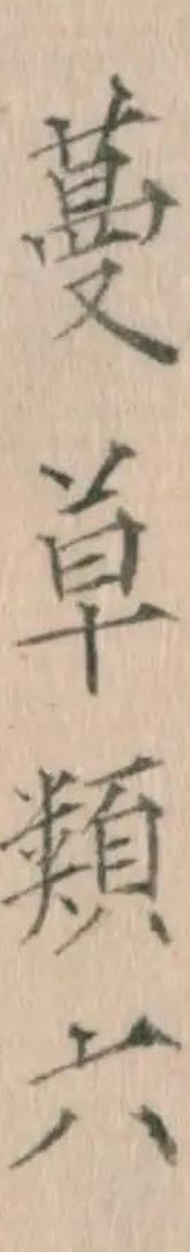蔓草類六

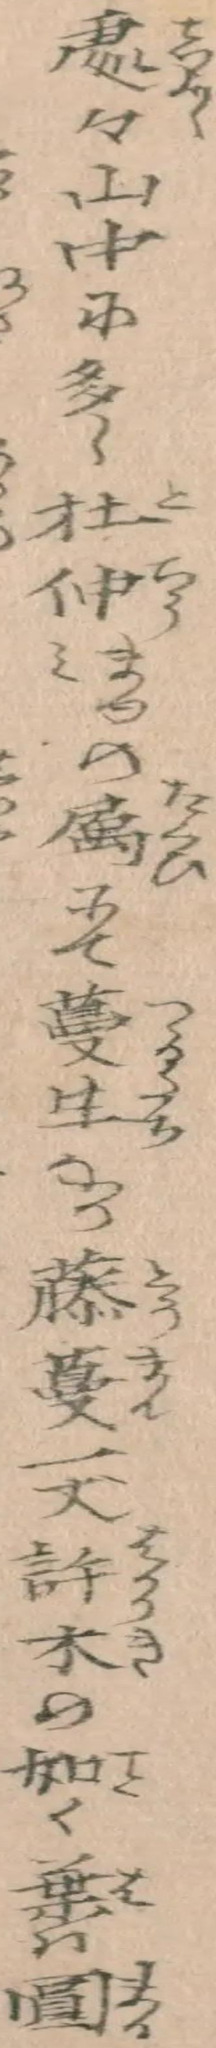処々山中に多し杜仲まゆみの属にて蔓生なり藤蔓一丈許木の如く葉は円
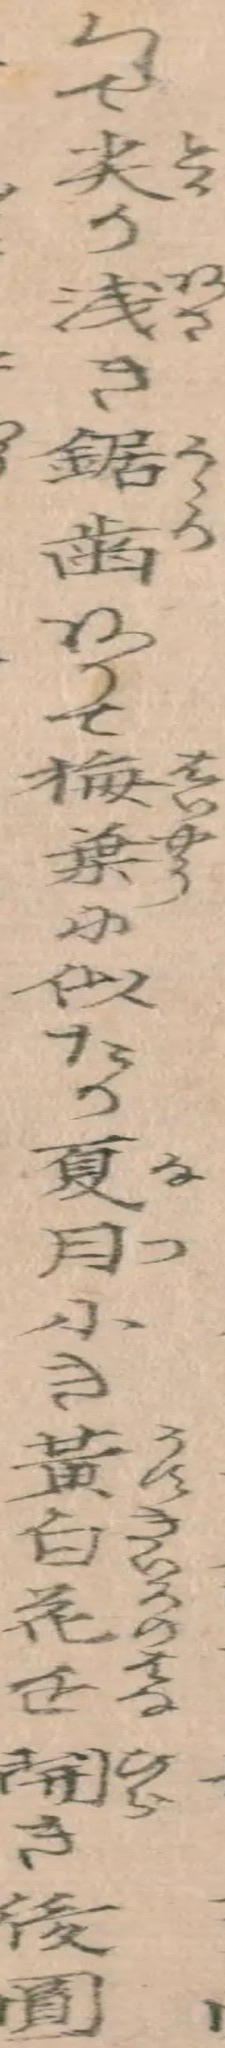くして尖り浅き鋸歯ありて梅葉に似たり夏月小き黄白花を開き後円
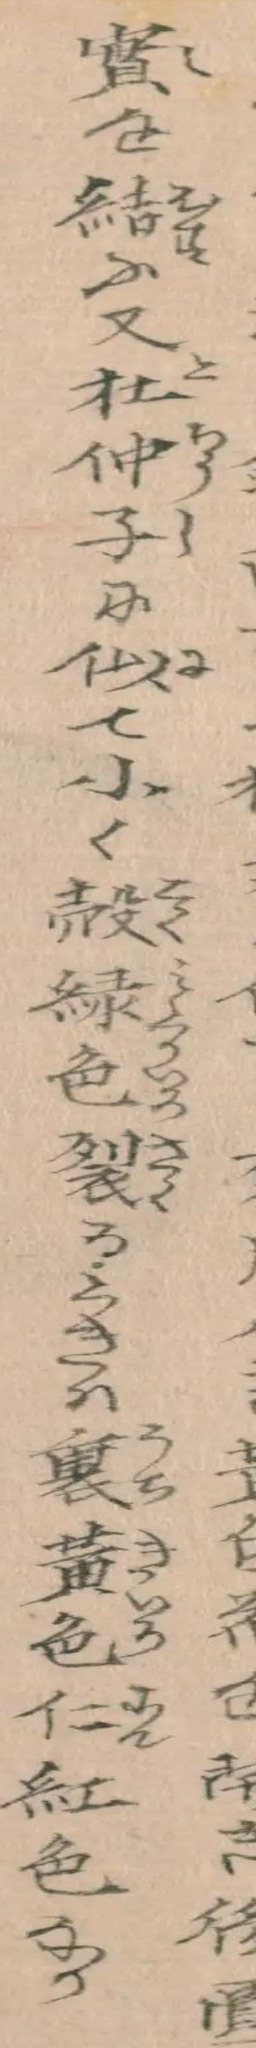実を結ふ又杜仲子に似て小く穀緑色裂るときは裏黄色仁紅色なり

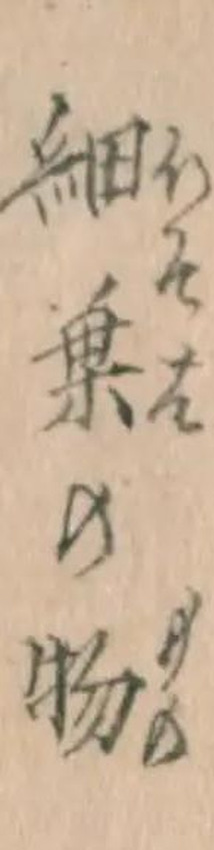細葉の物
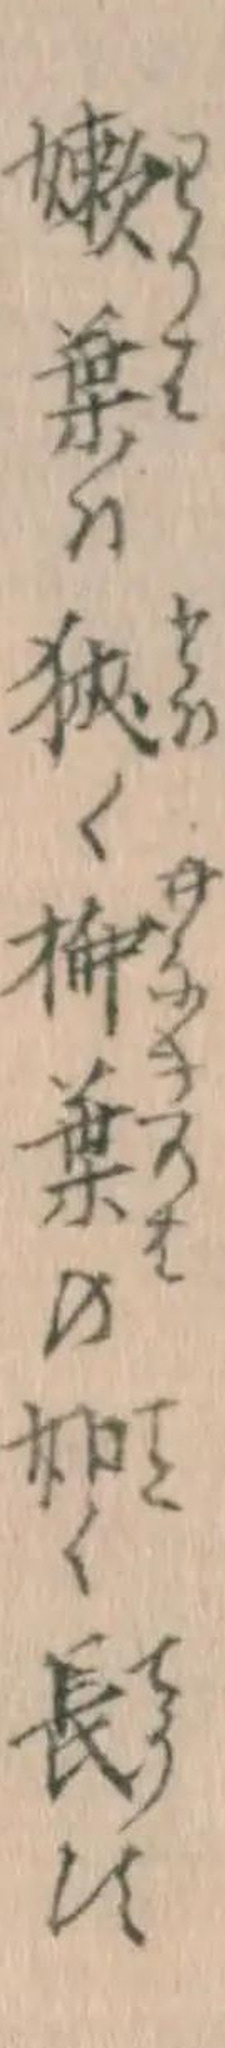嫩葉は狭く柳葉の如く長す
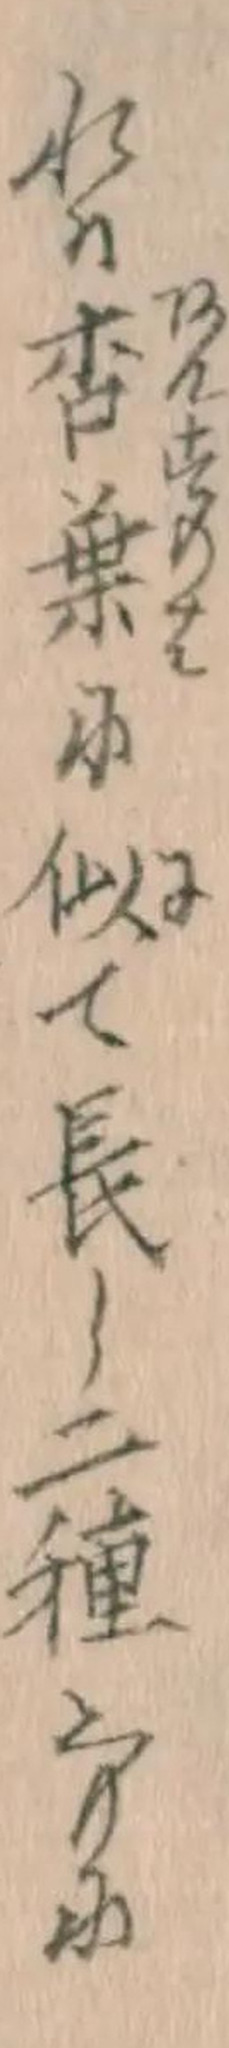れは杏葉に似て長し二種ともに
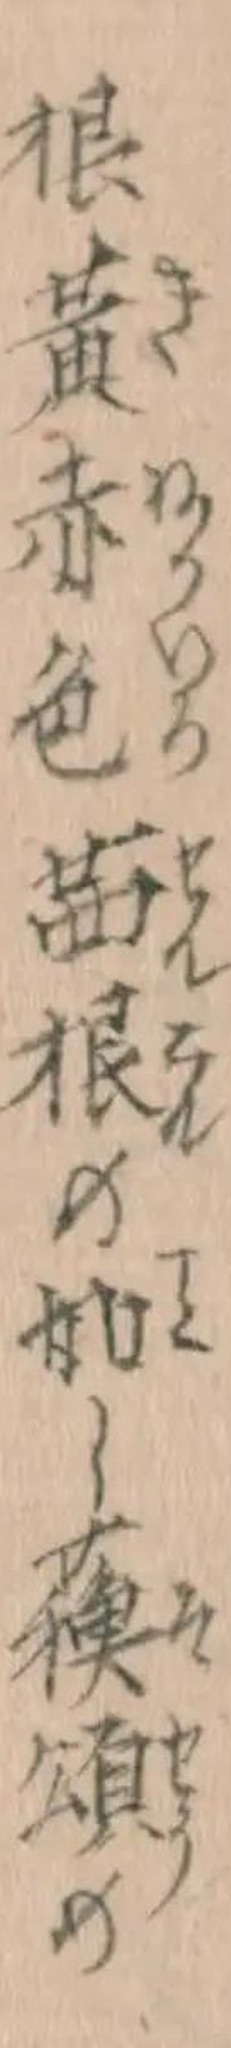根黄赤色茜根の如し蘇頌の
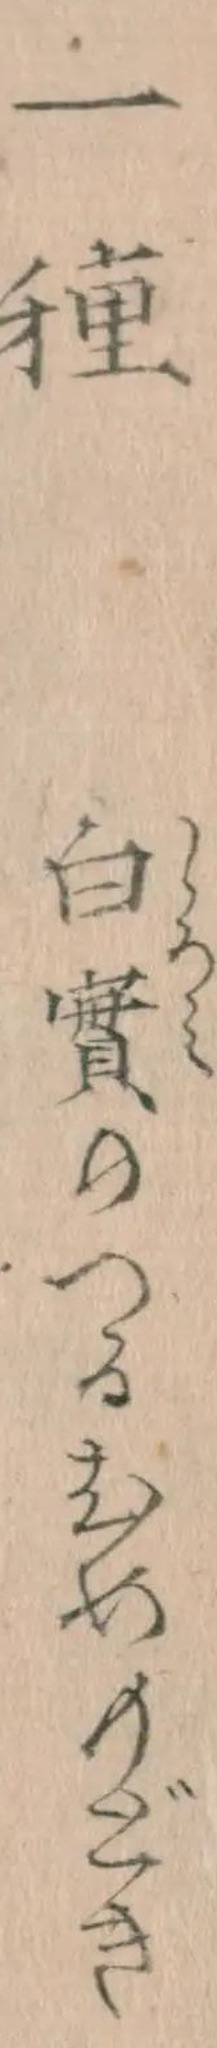一種白実のつるむめもどき
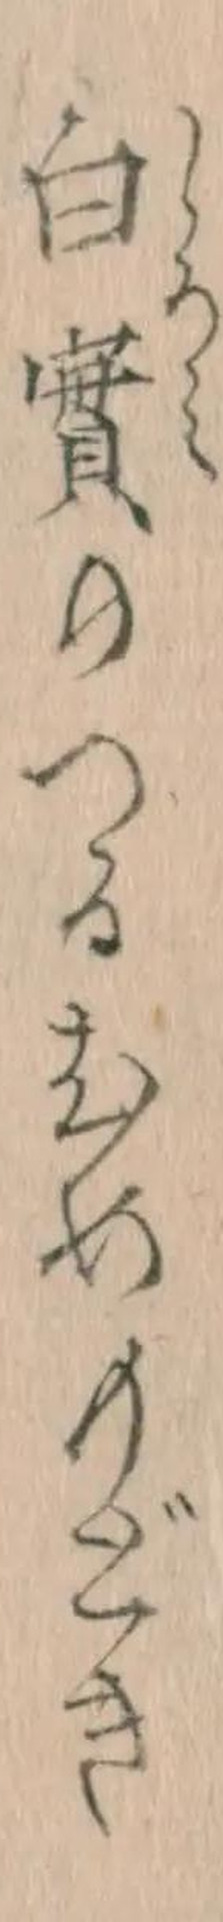白実のつるむめもどき
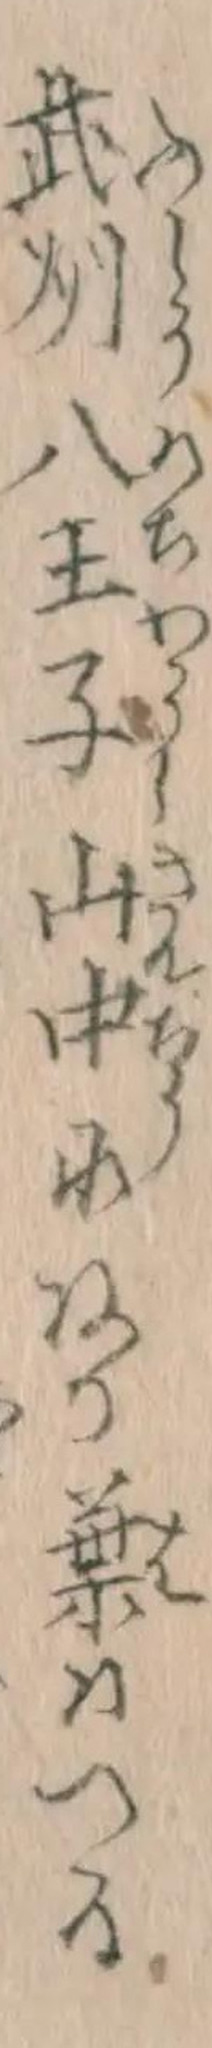武州八王子山中にあり葉はつる
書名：本草図譜. 巻28-30
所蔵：国立国会図書館 National Diet Library, JAPAN
